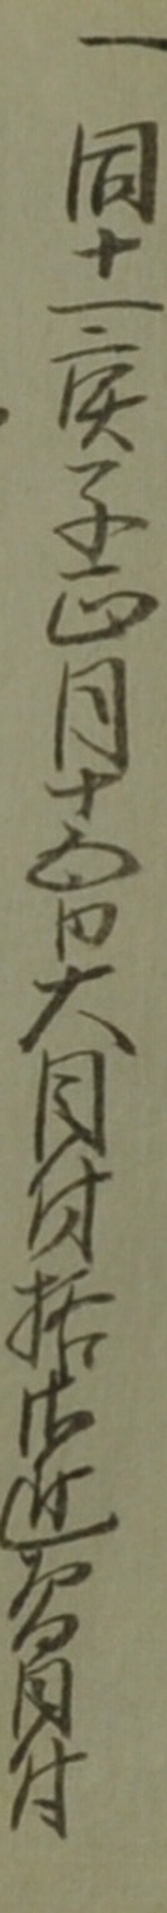一同十一庚子正月十五日大目付格御近習目付
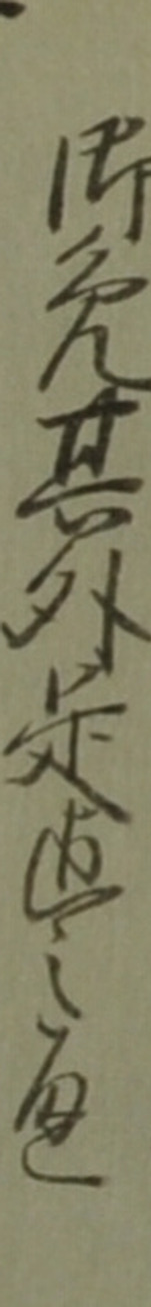御免其外是迄之通
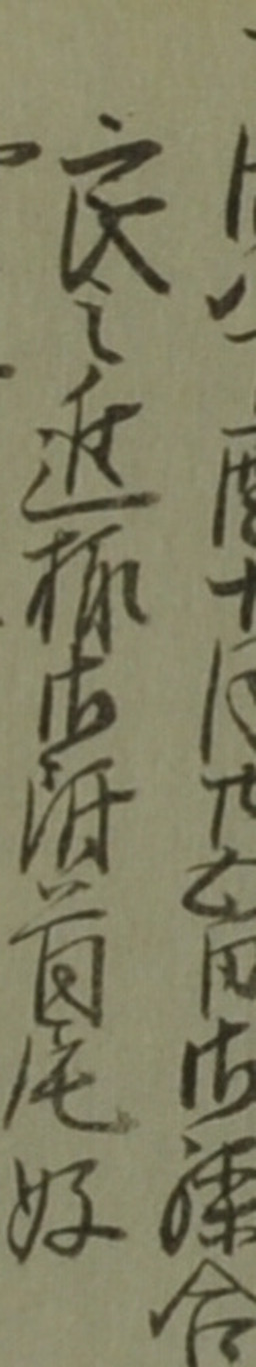良之進様御附首尾好
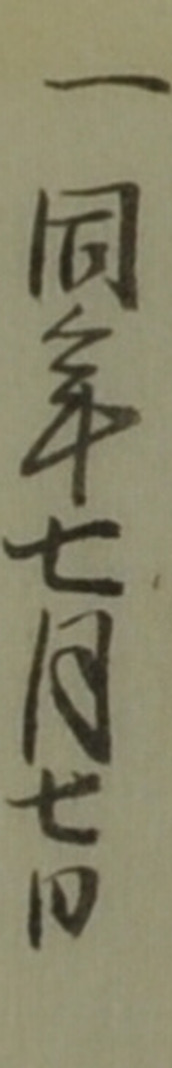一同年七月七日
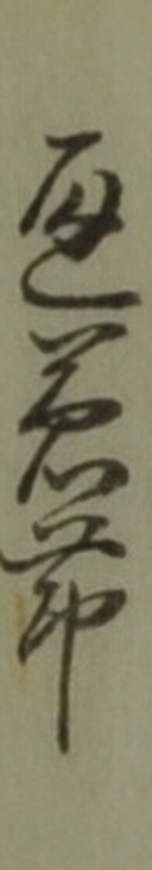通兼帯
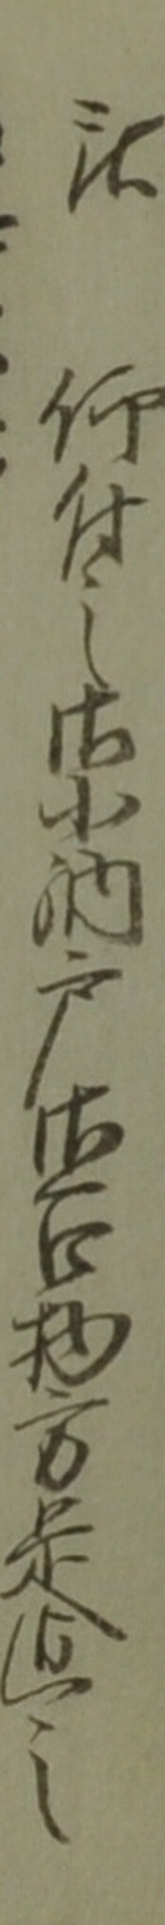被仰付之御小納戸御召物方是迄之
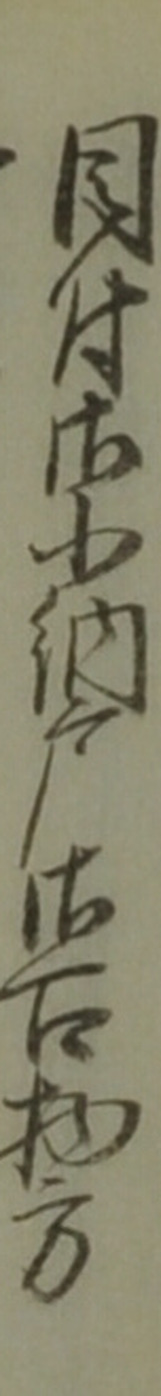目付御小納戸御召物方
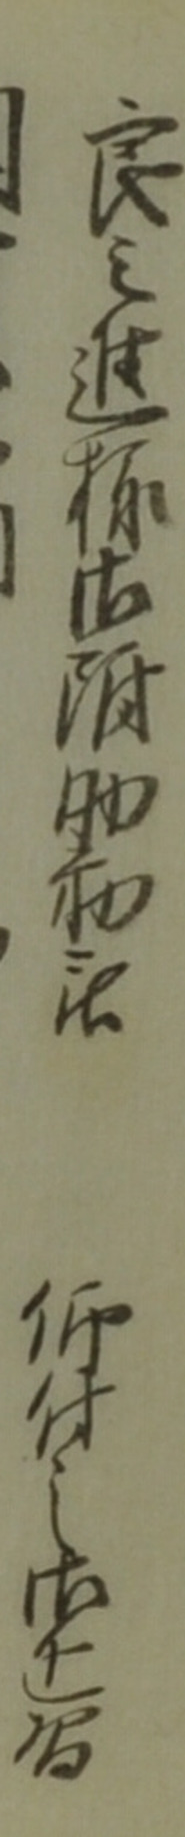良之進様御附助勤被仰付之御近習
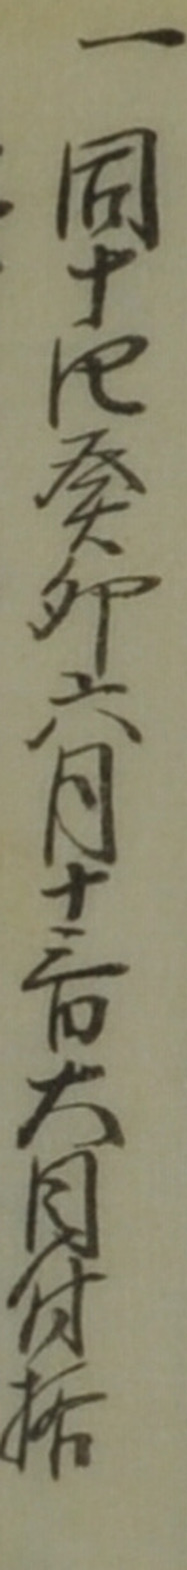一同十四癸卯六月十三日大目付格
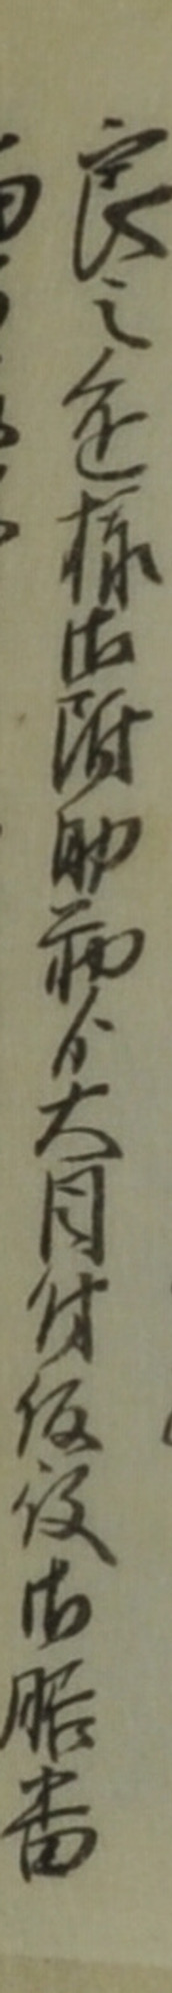良之進様御附助勤ゟ大目付仮役御膳番
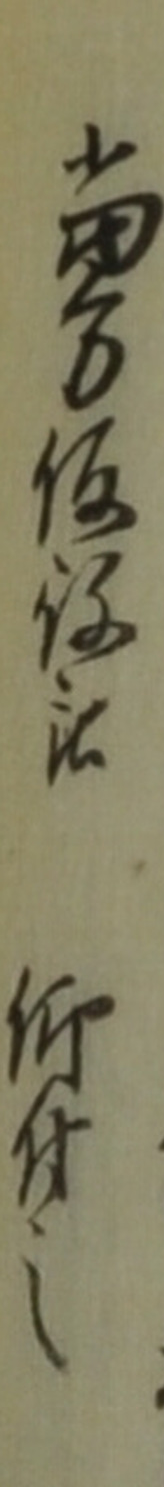当分仮役被仰付之
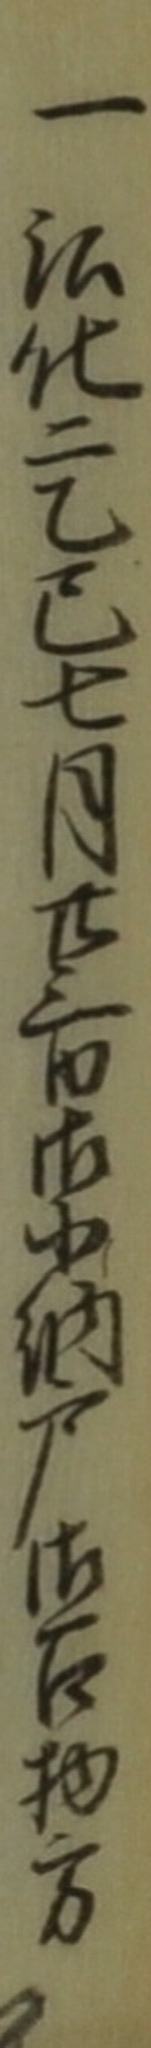一弘化二乙巳七月廿三日御小納戸御召物方
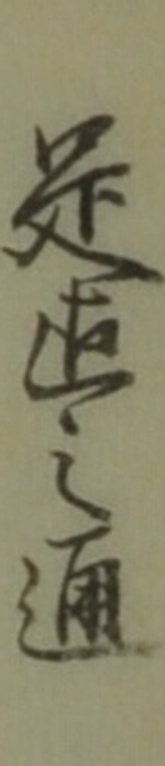是迄之通
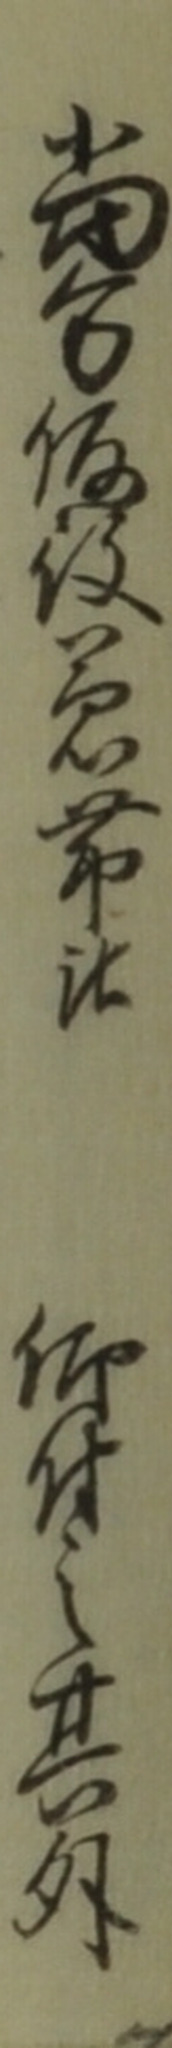当分仮役兼帯被仰付之其外
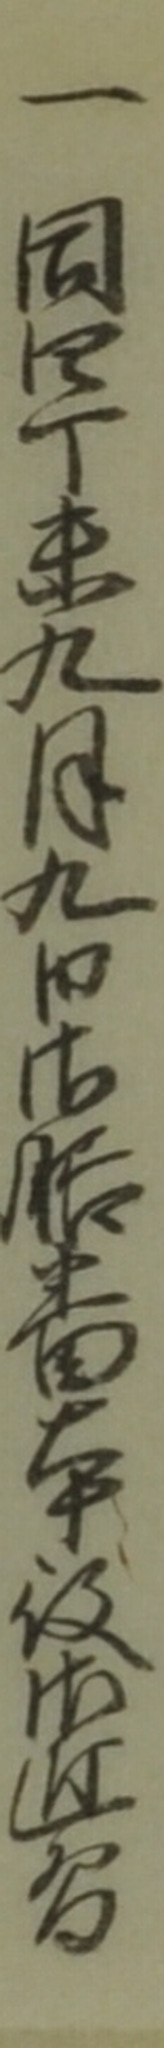一同四丁未九月九日御膳番本役御近習
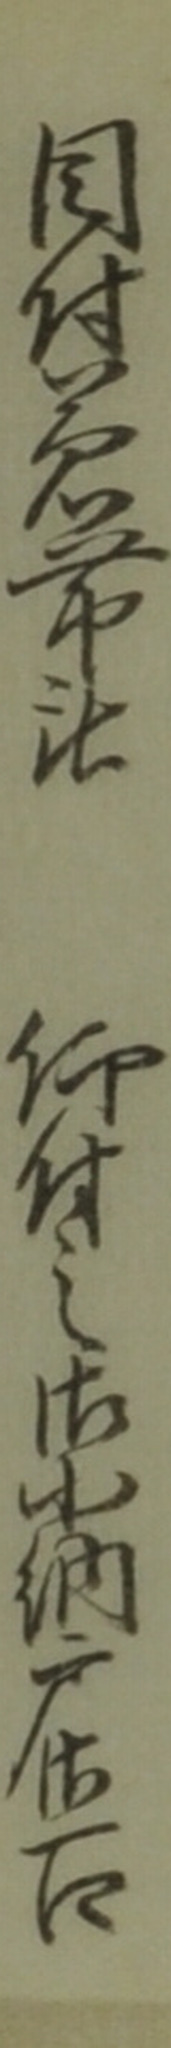目付兼帯被仰付之御小納戸御召
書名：諸御役代々録（五）
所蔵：伊那市立高遠町図書館・合同会社AMANE
